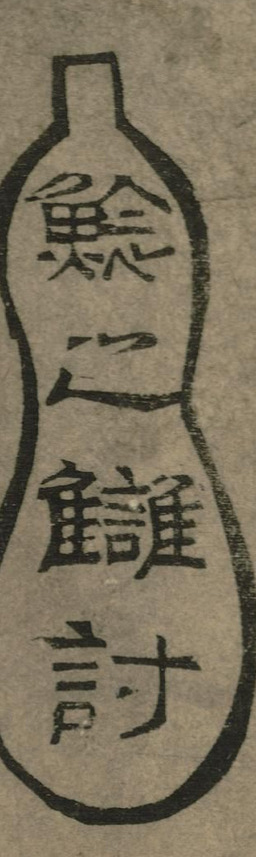鯰之仇討
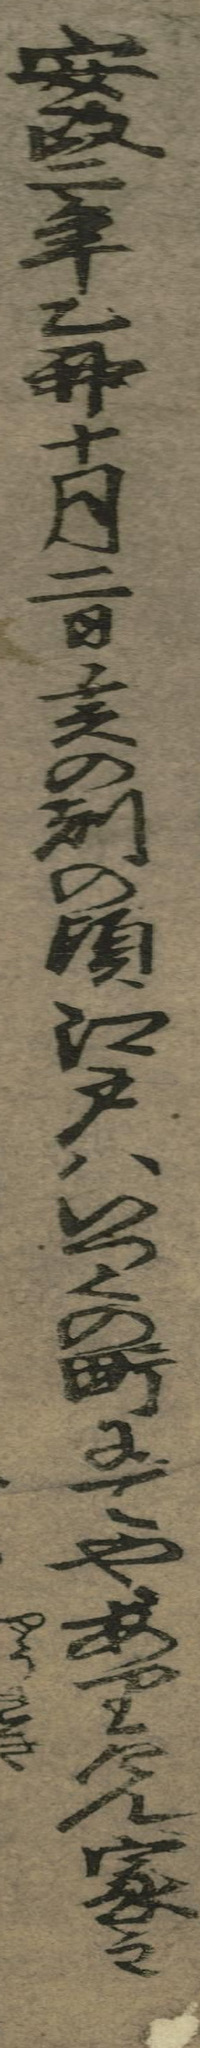安政二年乙卯十月二日亥の刻の頃江戸ハいつくの町にてやありけん家々
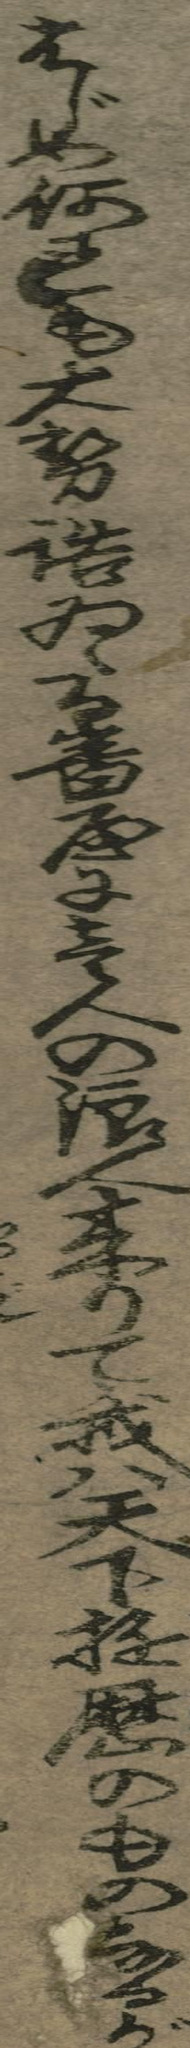はじめ何れも大勢詰ゐたる番屋に壱人の浪人来りて我ハ天下遊歴のものなるが
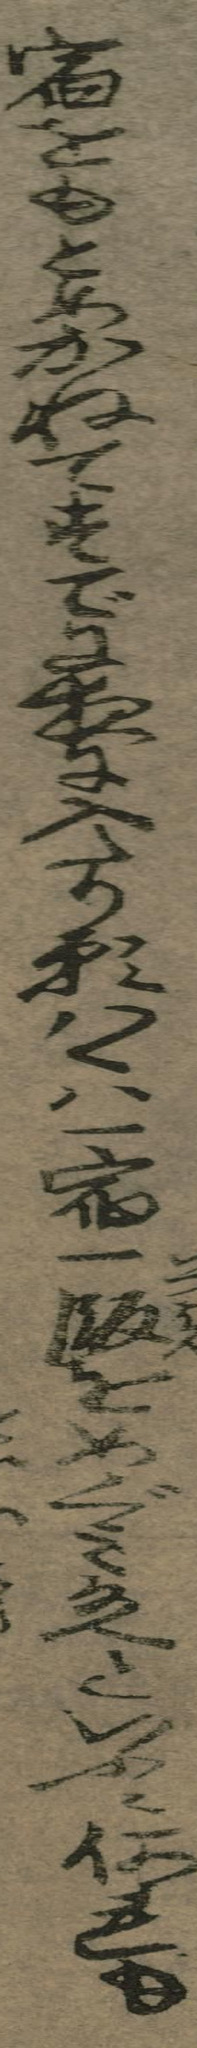宿をもとめかねてすでに夜に入たり願はくは一宿一飯をめぐみ給へといふニ何れも
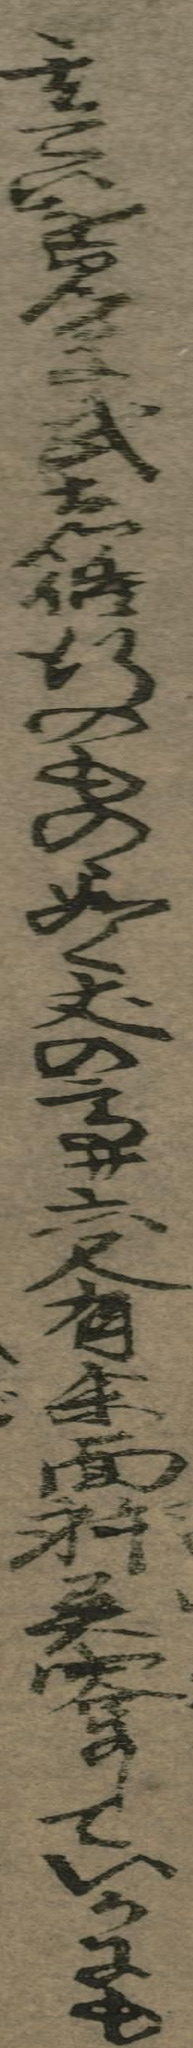其ていを見るに武者修行のものゝ如く丈の高サ六尺有余面躰異容にしていかにも
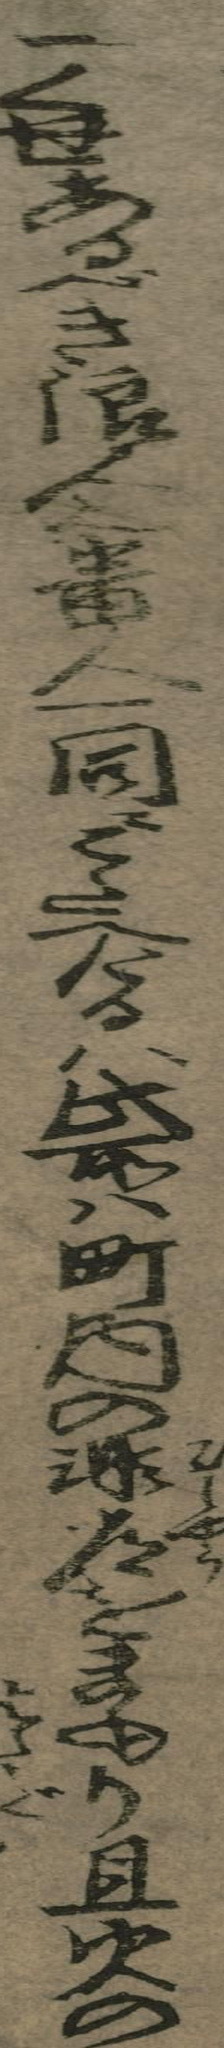一くせあるべき浪人也番人一同ニこたへけるは此所は町内の非常をまもり且火の
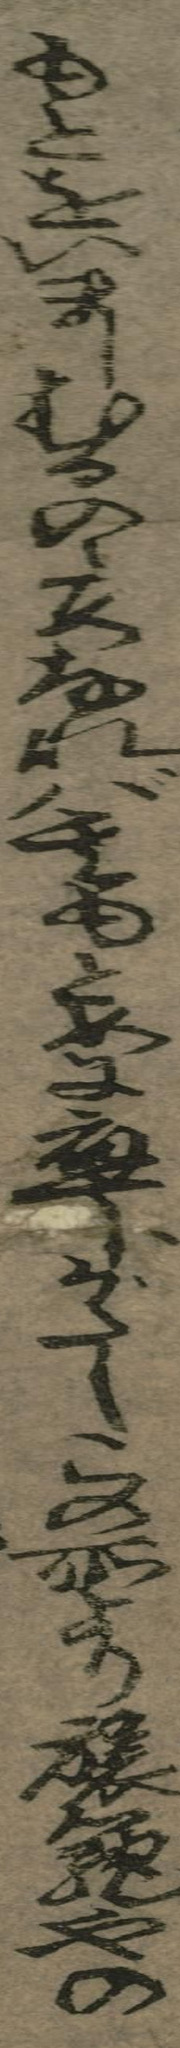もとをいましむるの？なれば其もとめに応じかたしこの所より旅籠やの
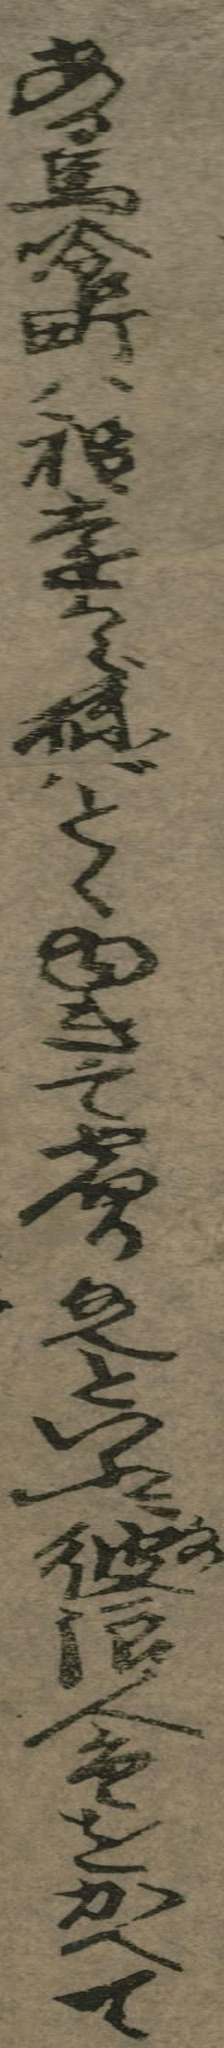ある馬喰町は程遠から様ばとくゆきて宿り給へといふニ彼浪人色をかへて
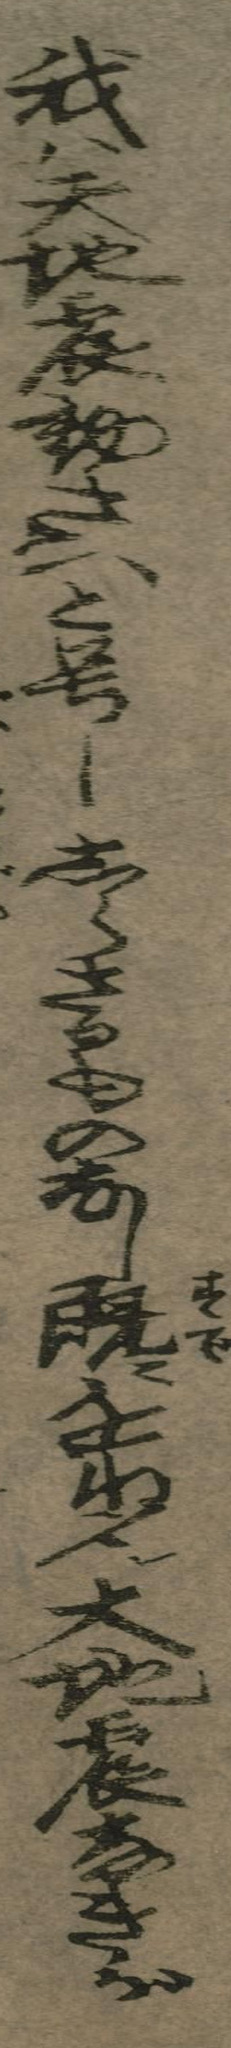我は天地震動さいと号ししらさるものなし既ニ近年大地震なきが
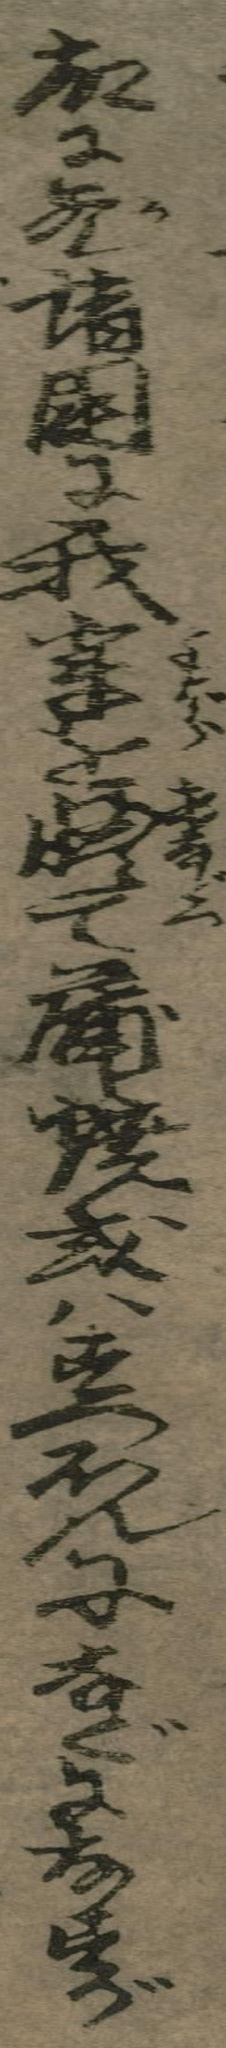故に歟諸国に我輩を軽て蒲焼或はすつほんになどになすが
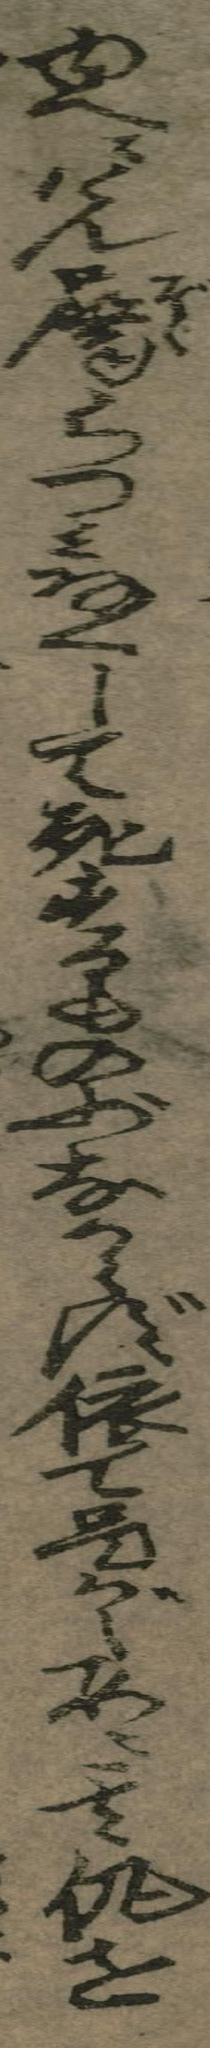ゆへニけん属らつみなくして死するもの少なからず依て是がためニ其仇を
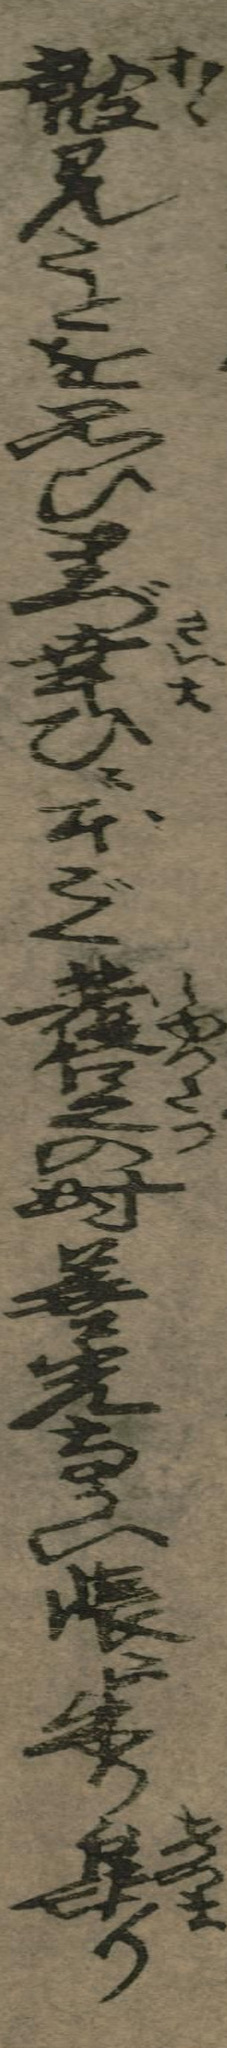報わんことを思ひまづ幸ひニ本ごく発足の時善光寺かい帳ニ来り集り
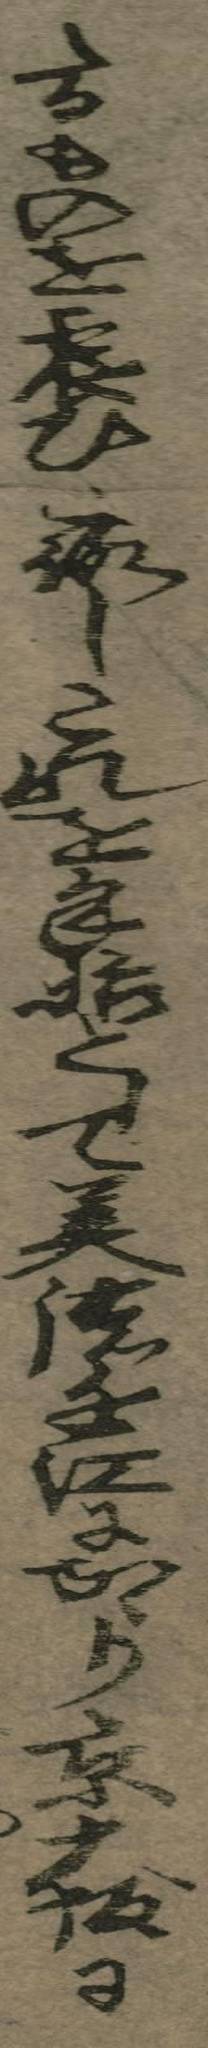たるものを震ひ落しこれを手始として美濃近江にかゝり京大坂に
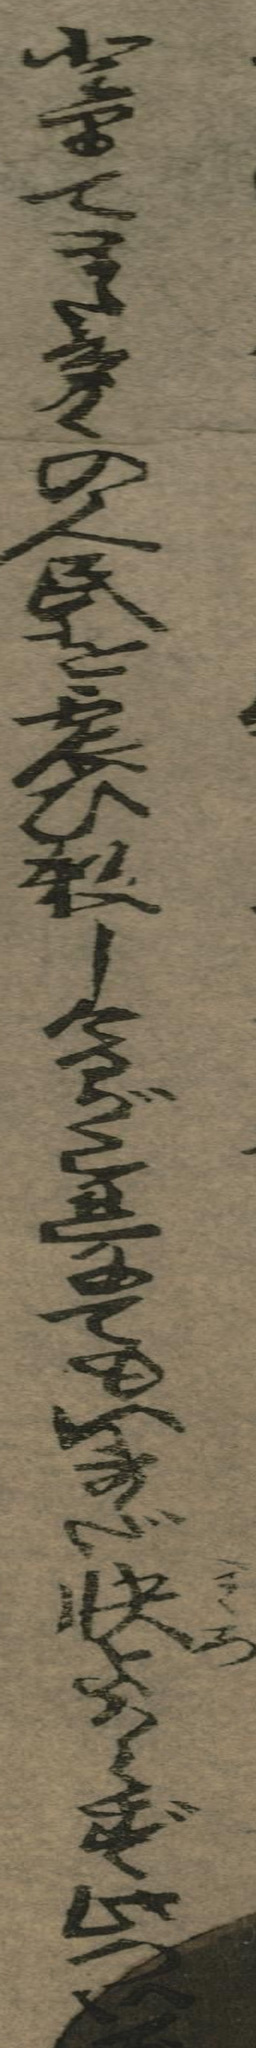登りてまた多くの人民を震ひ殺しけるがこれにてもいまだ快よからず此ついでに
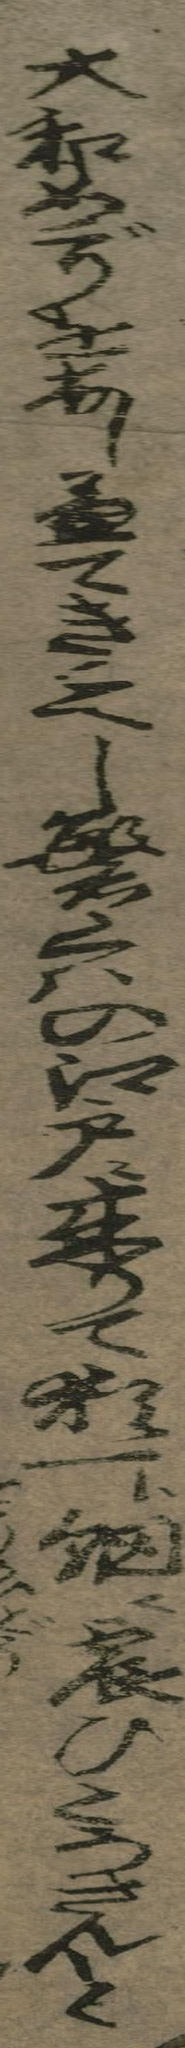大和めぐりをなし兼てきこへし繁くはの江戸ニ来りて猶一ト網ニ震ひころさんと
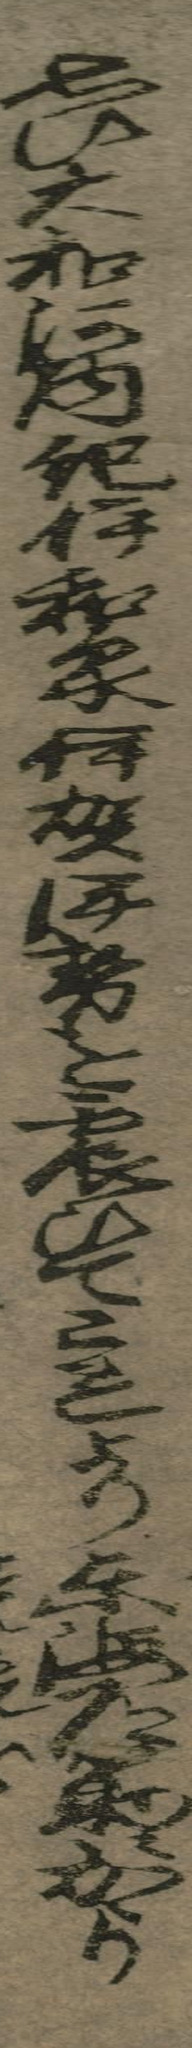思ひ大和河内紀伊和泉伊賀伊勢を震ひてこれより東海道筋ニかゝり
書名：鯰之讎討
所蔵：東京大学地震研究所図書室 Earthquake Research Institute Library, The University of Tokyo, JAPAN
